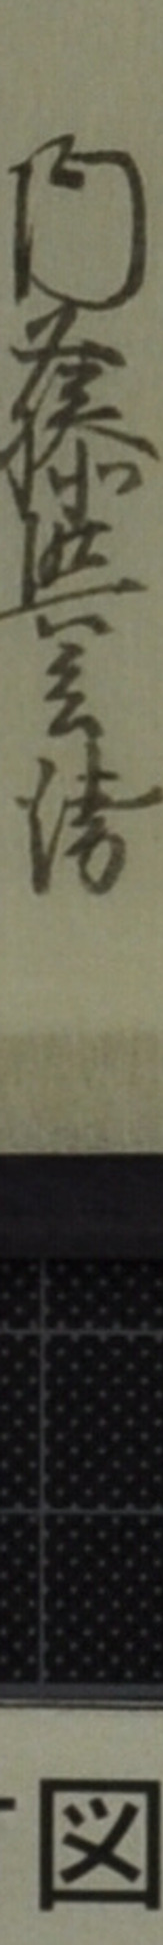内藤与兵衛
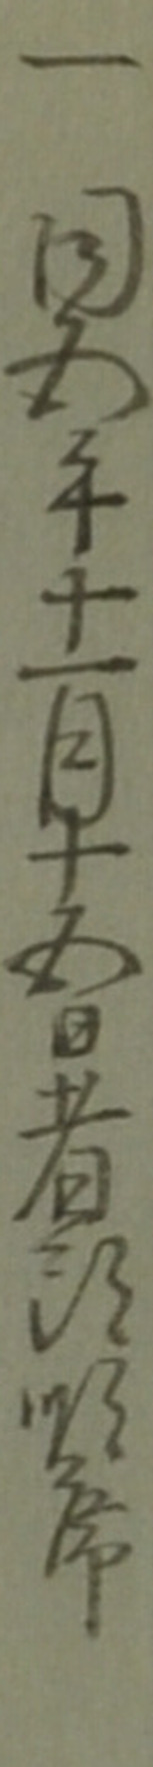一同五午十一月十五日者頭順席
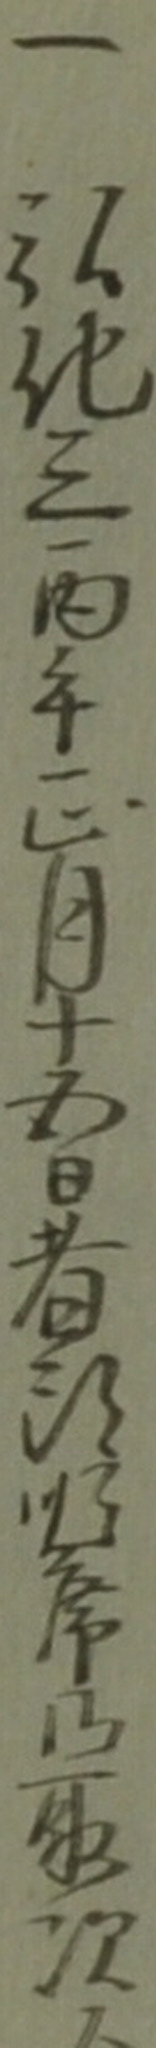一弘化三丙午正月十五日者頭順席御取次ゟ
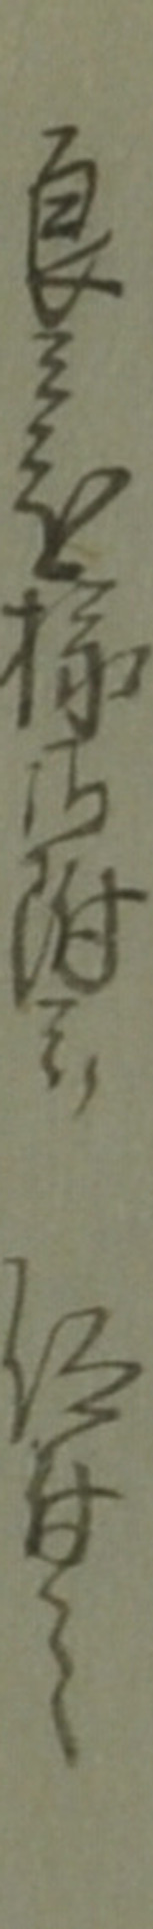良之進様御附被仰付之
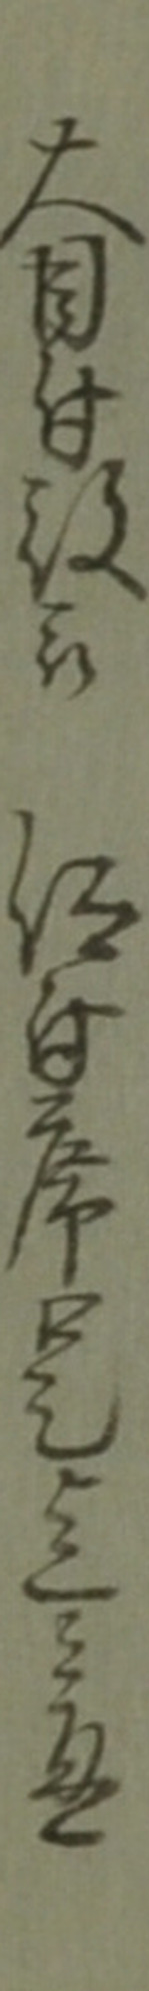大目付役被仰付席是迄之通
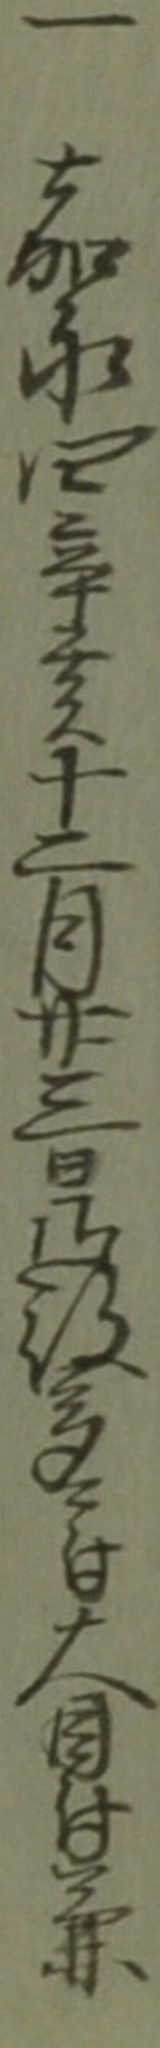一嘉永四辛亥十二月廿三日御役多ニ付大目付兼
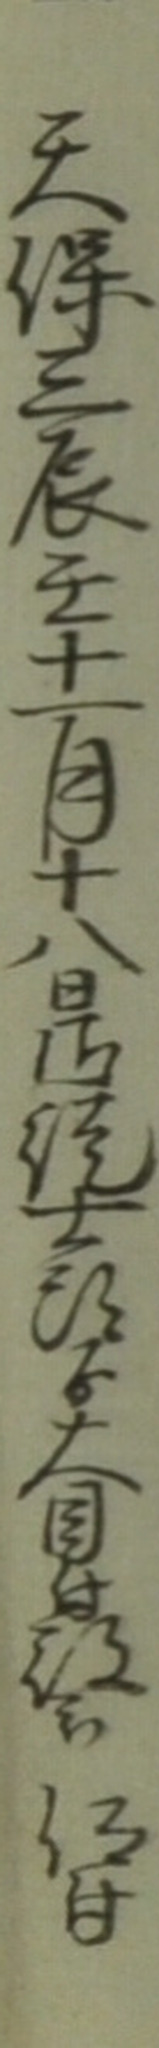一天保三辰閏十一月十八日御徒士頭ゟ大目付役被仰付
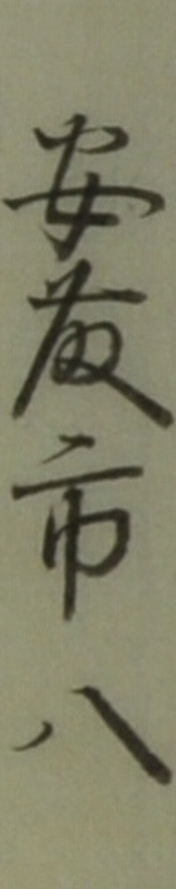安藤市八

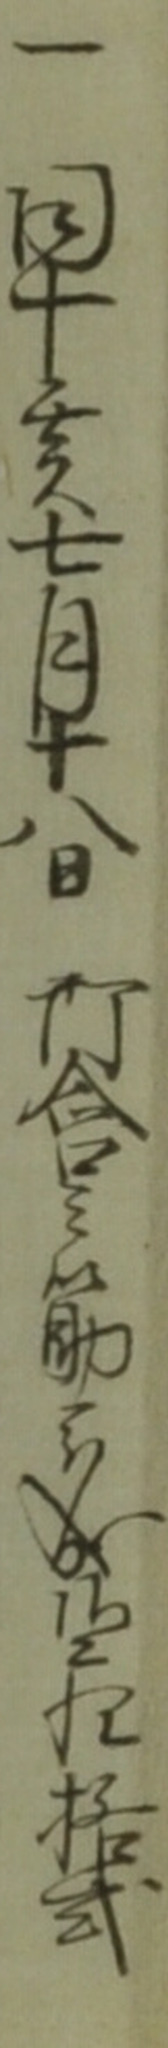一同十亥七月十八日御含之筋被成御座格式
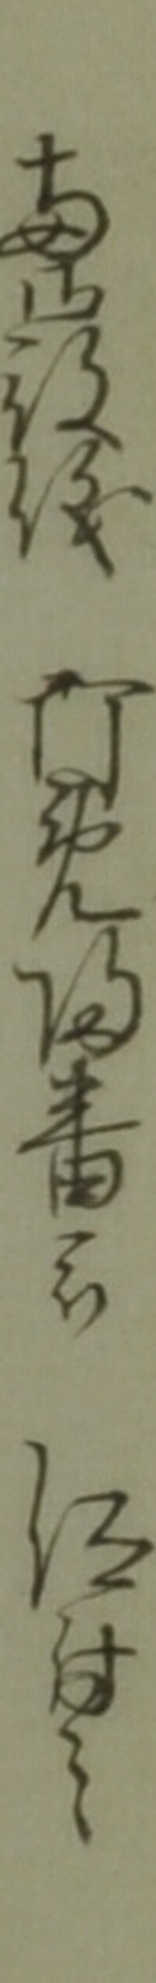両御役儀御免帰番被仰付之
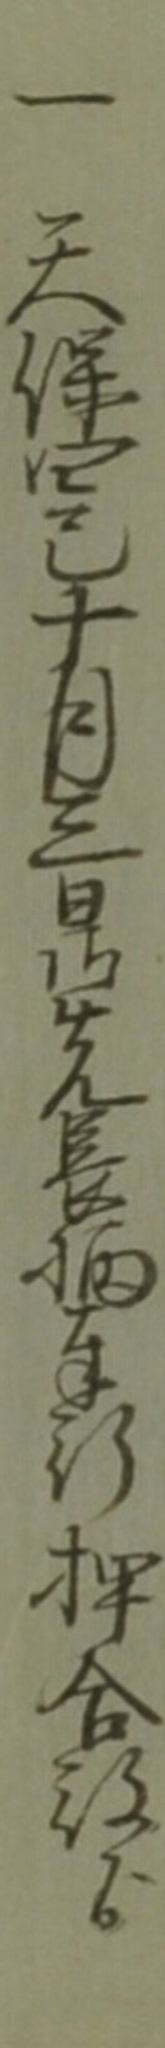一天保四己十月三日御先長柄奉行押合役ゟ
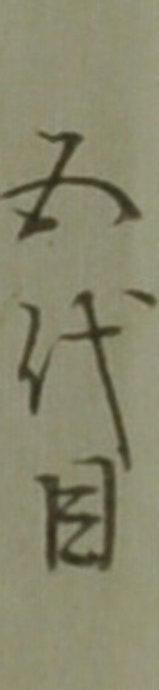五代目
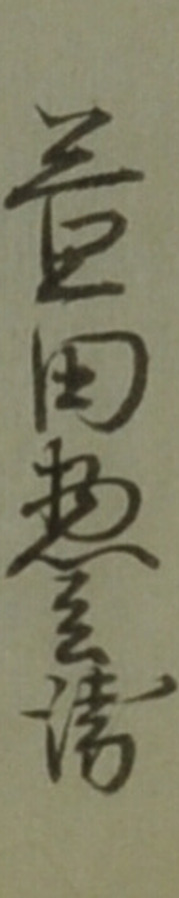益田惣兵衛
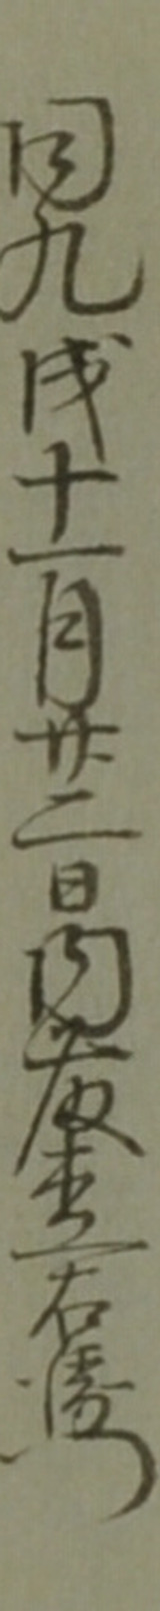一同九戌十一月廿二日内藤杢右衛門
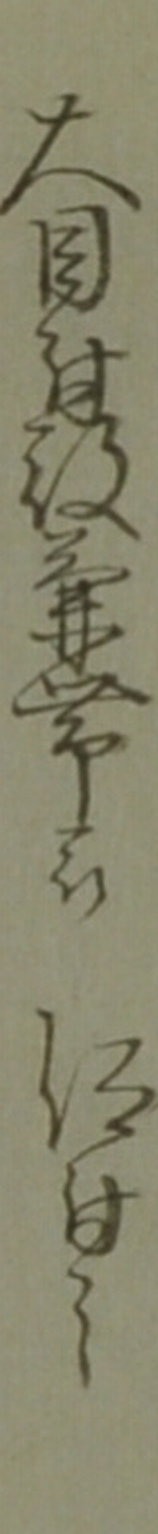大目付役兼帯被仰付之
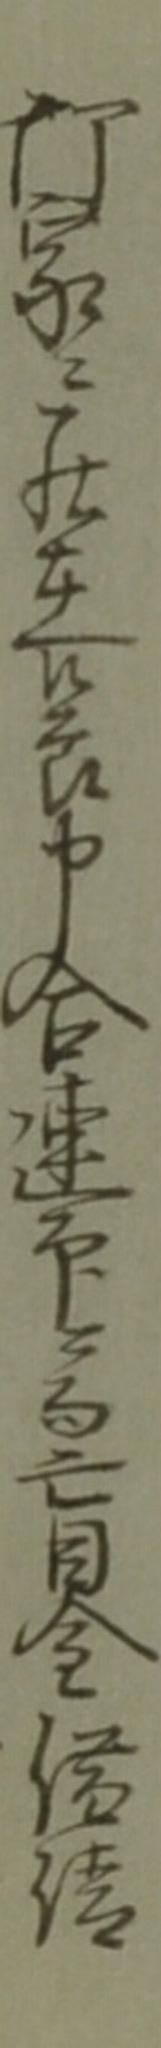御家ニ罷在候節申合連印ニ而盲金借請
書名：諸御役代々録（三）
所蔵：伊那市立高遠町図書館・合同会社AMANE
